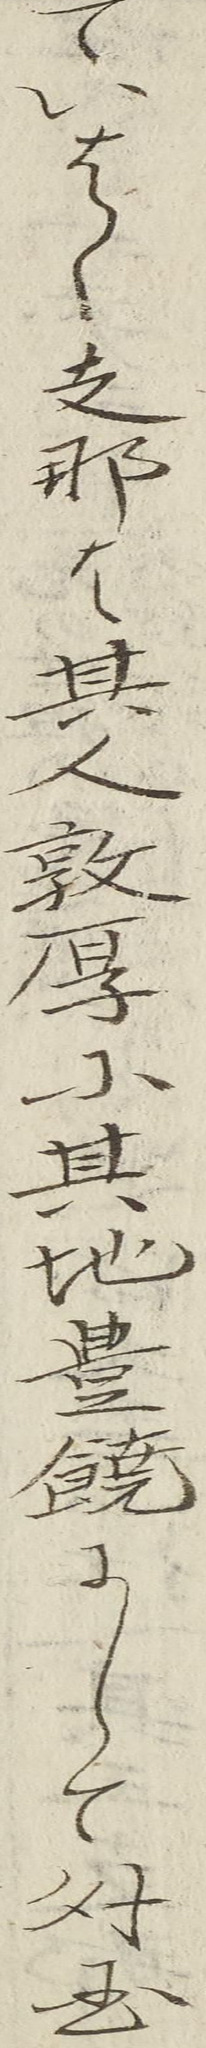ていはく支那は其人敦厚に其地豊饒にして外国
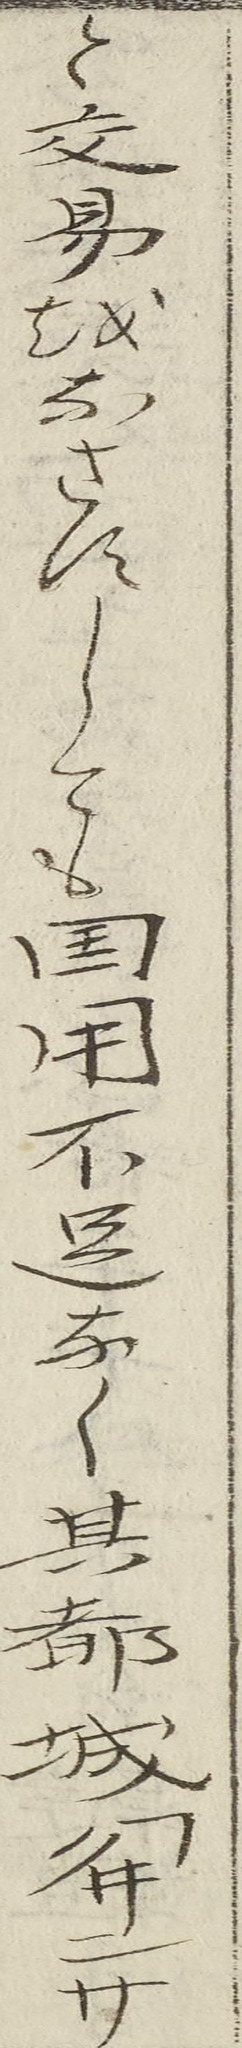と交易をなさすしても国用不足なく其都城「ク井サ
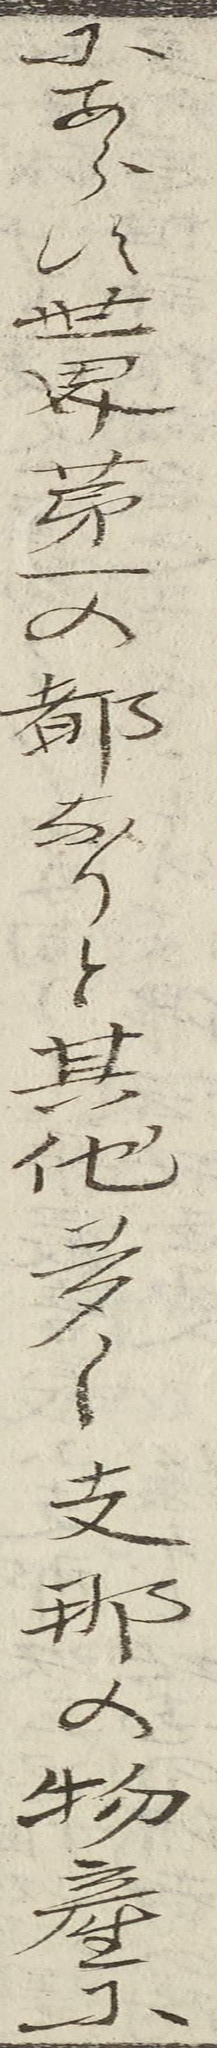にあらす世界第一の都なり其他多く支那の物産に
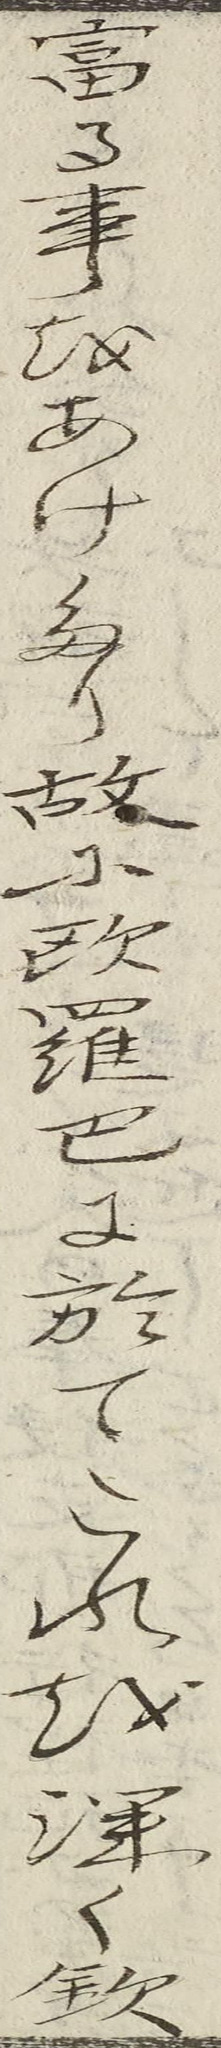冨る事をあけたり故に欧羅巴に於てこれを深く欽
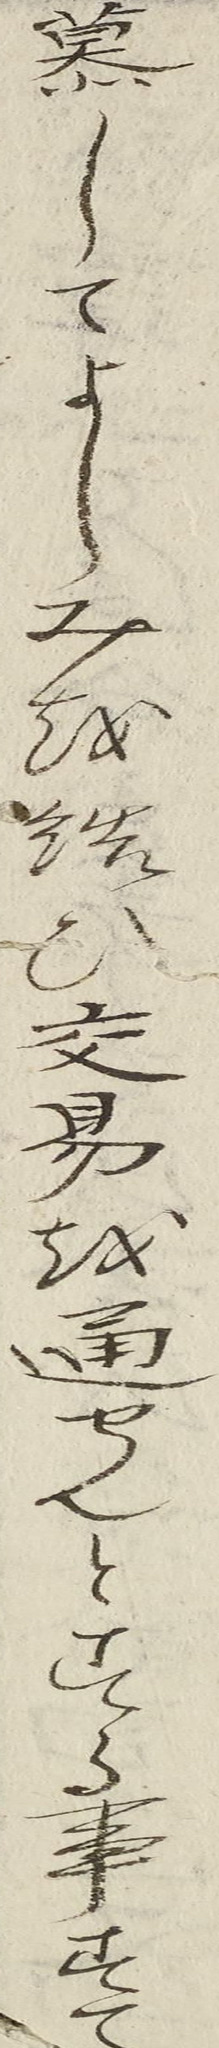慕してよしみを結ひ交易を通せんとする事あたはす
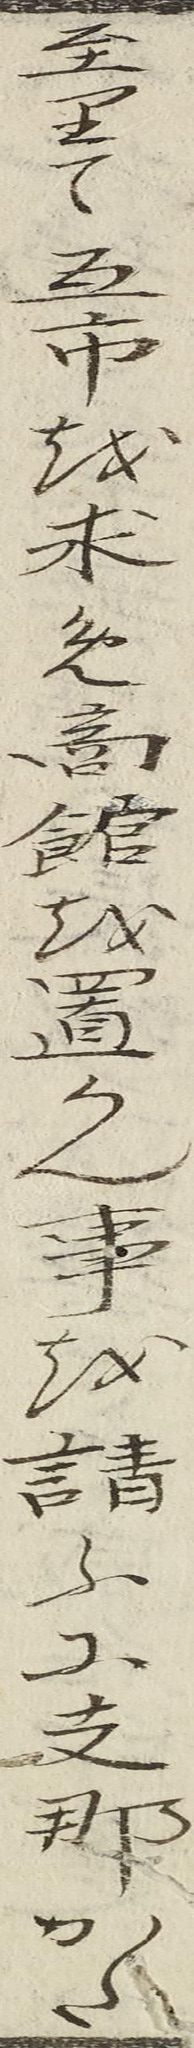至りて互市を求め商館を置かん事を請ふに支那かた
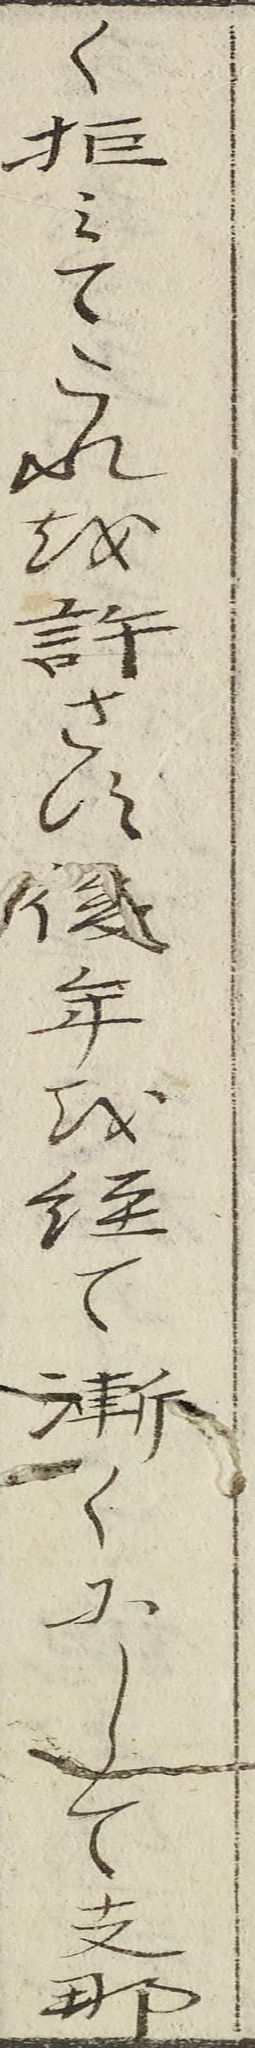く拒ミてこれを許さす幾年を経て漸くにして支那
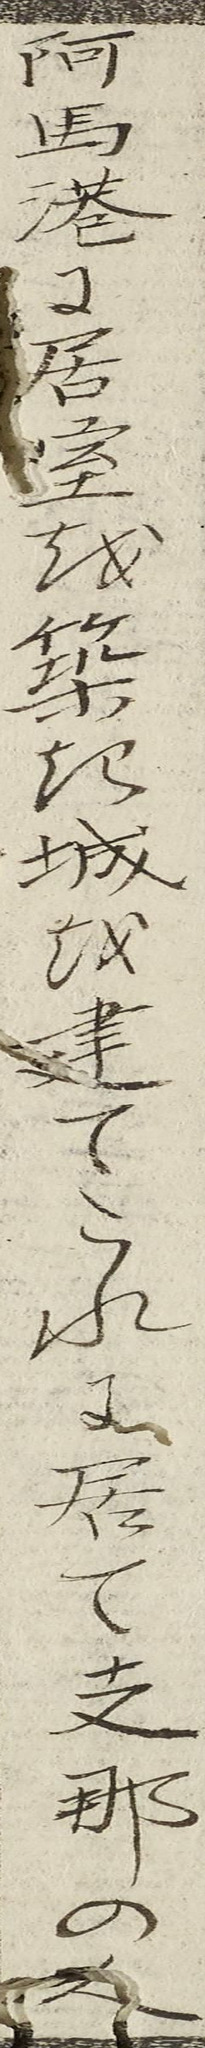阿馬港に居室を築き城を建てこれに居て支那の人
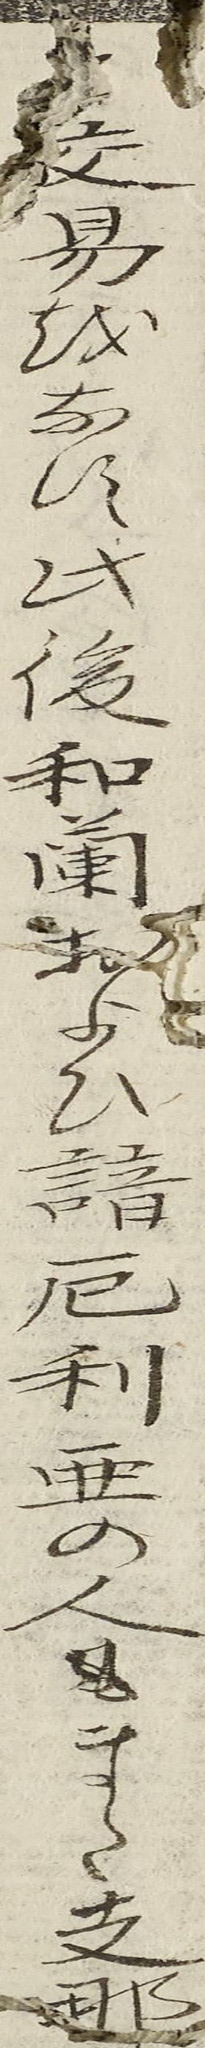と交易をなす此後和蘭およひ諳厄利亜の人もまた支那
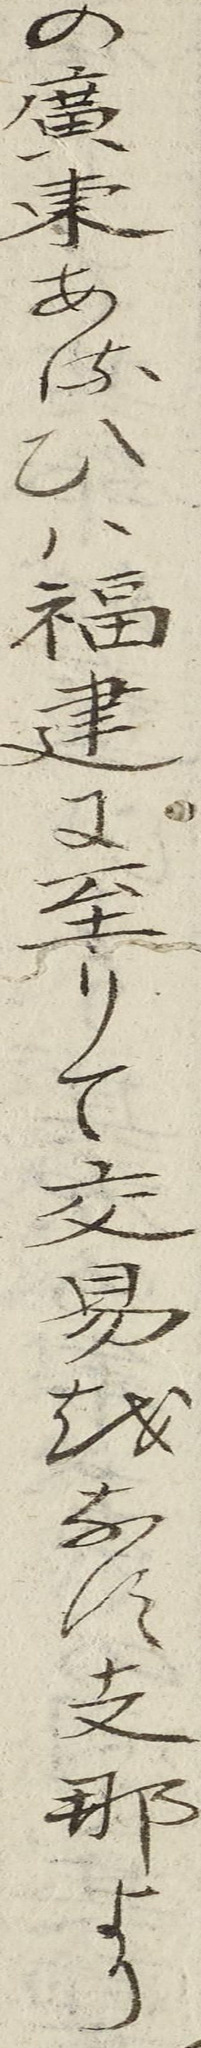の広東あるひハ福建に至りて交易をなす支那より
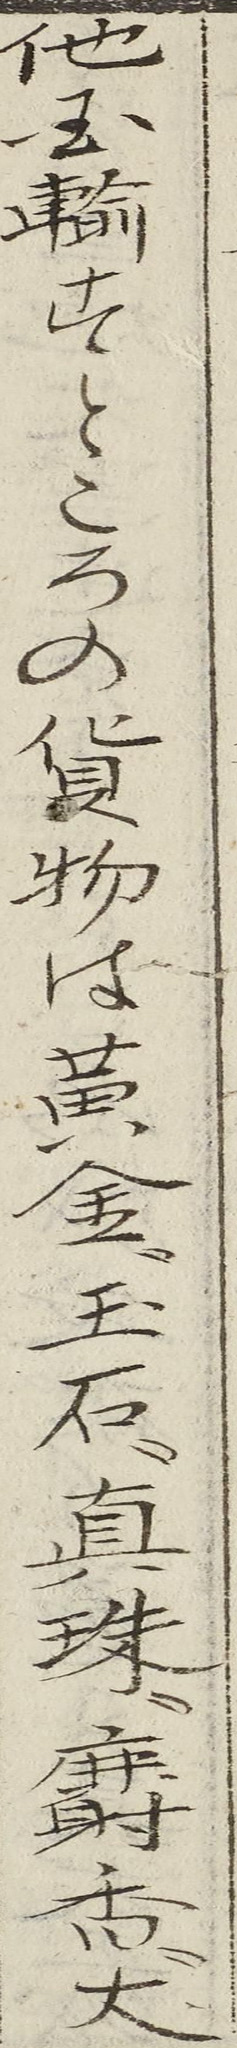他国輸すところの貨物は黄金。玉石。真珠。麝香。大
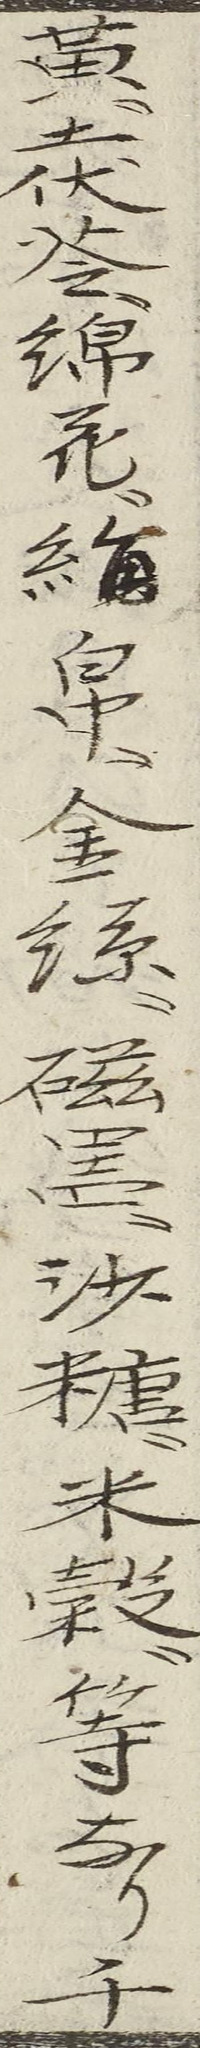黄。土伏苓。綿花。絹帛。金絲。磁器。沙糖。米穀。等なり千
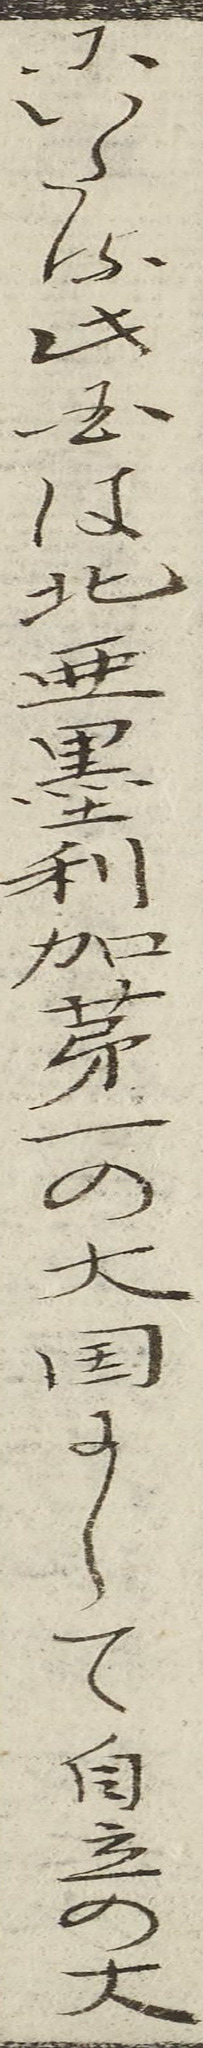にいたる此国は北亜墨利加第一の大国にして自立の大
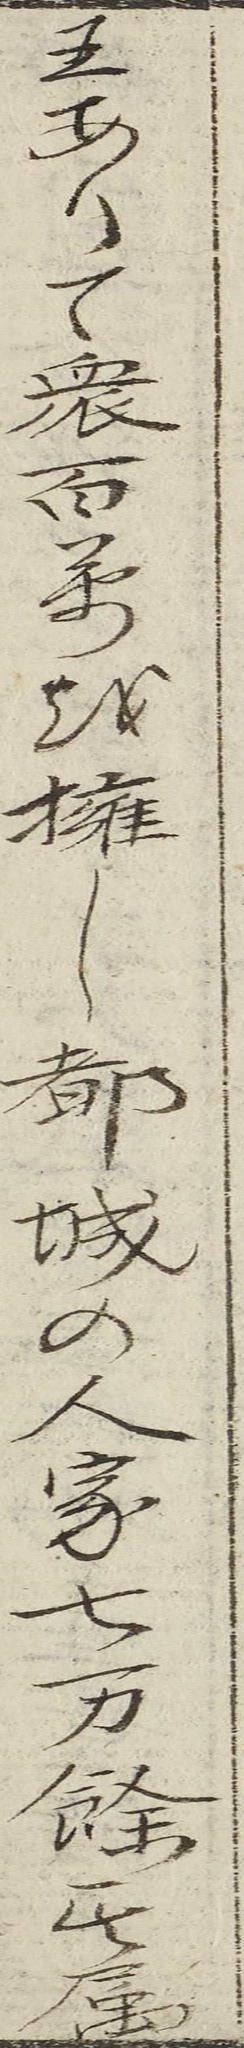王ありて衆百万を擁し都城の人家七万余其属

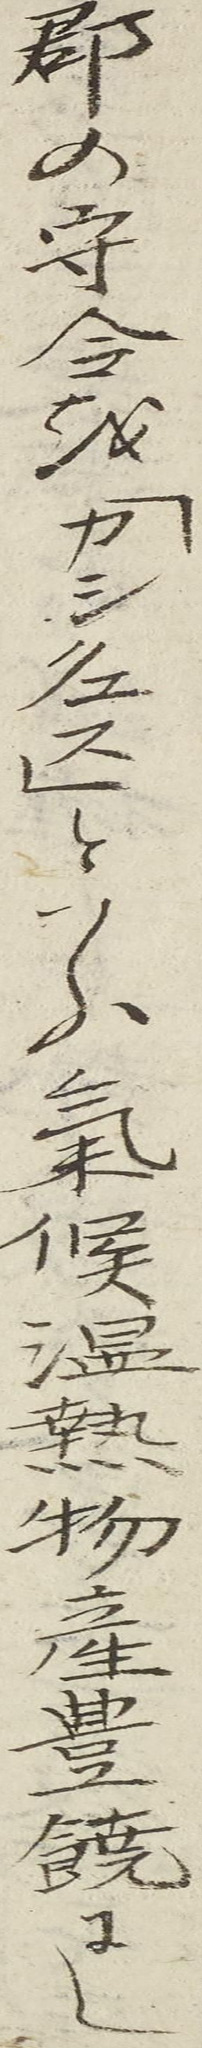郡の守令を「カシクュス」といふ気候温熱物産豊饒にｓ
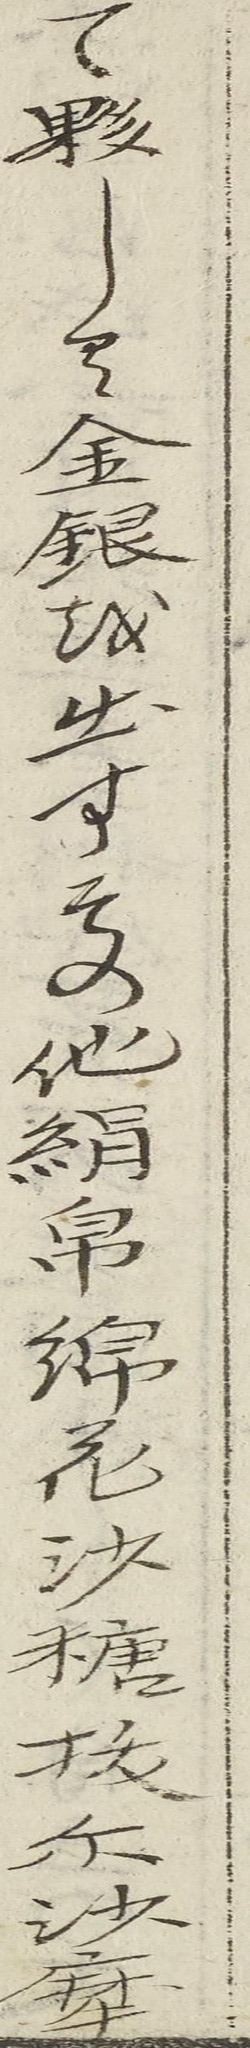て夥しく金銀を出す其他絹帛綿花沙糖抜尓沙摩
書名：西洋雜記　乾
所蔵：東京大学地震研究所図書室 Earthquake Research Institute Library, The University of Tokyo, JAPAN
